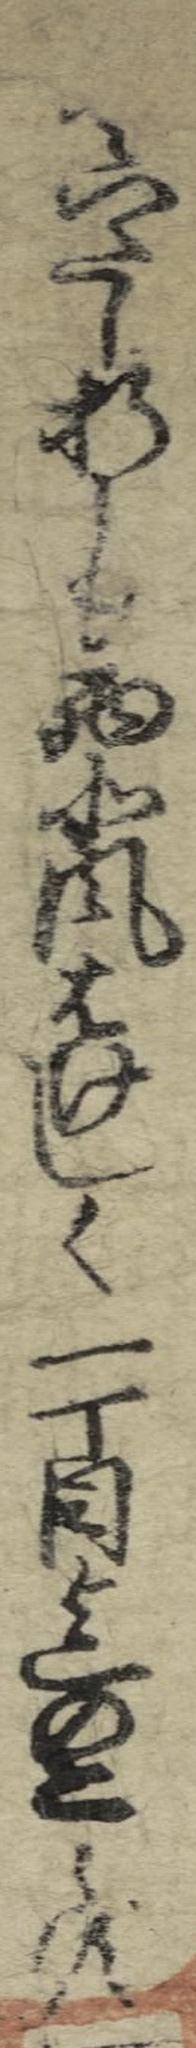いたし折しも西北風はけしく一丁目迄のこらず
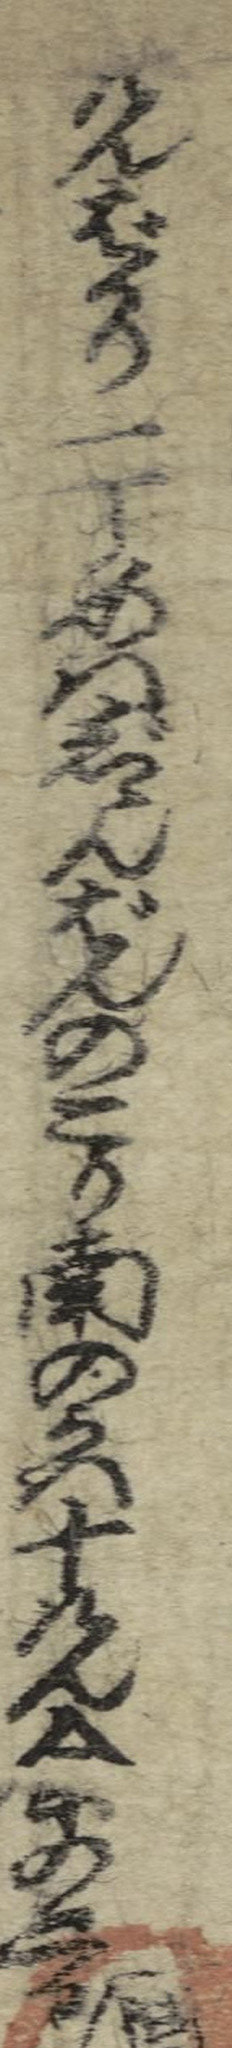けんはかり一丁めはじゝんばんのこり南の五十けん余のこる
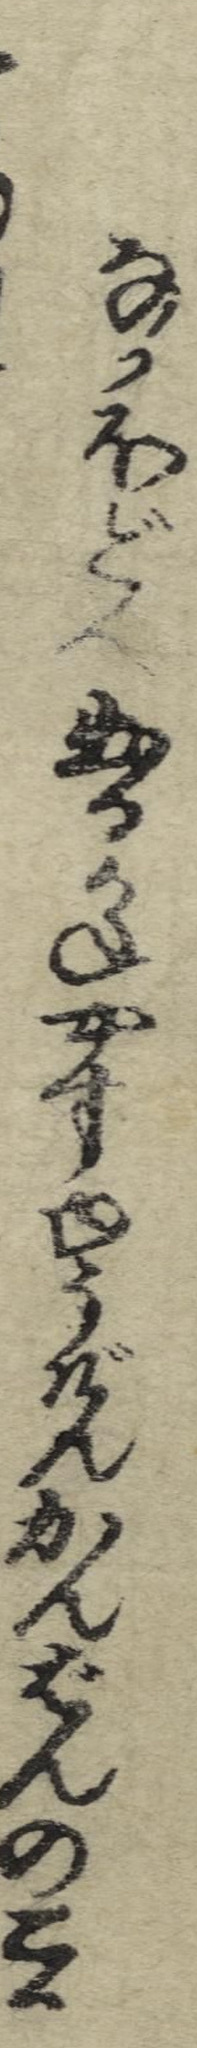なかほどへでるてかすやうげんかんばんのこる
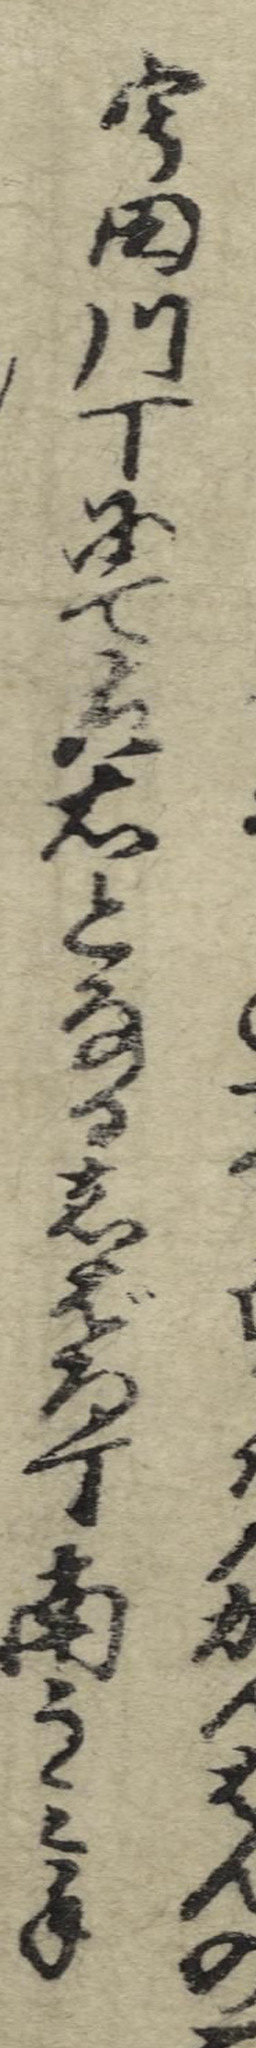宇田川丁にて左右となかしばゐ丁南うみて
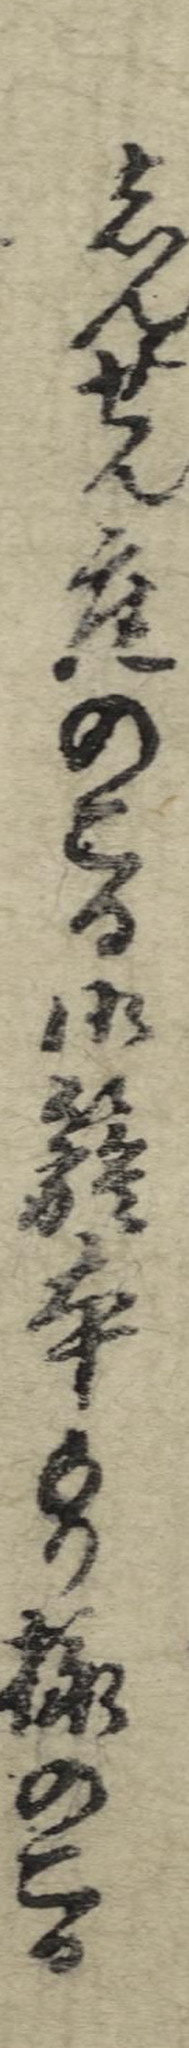しんせん座のこる御籏本もり様のこる
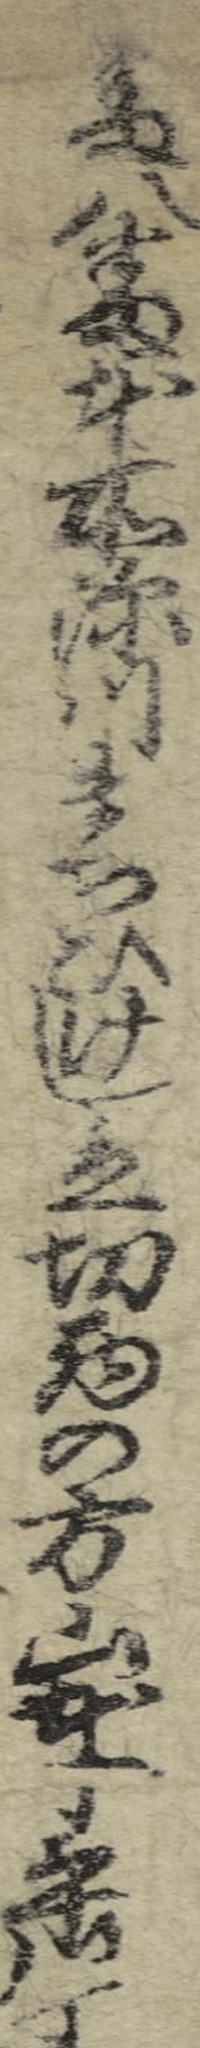番八番本所深川まちひけし立切西の方山本丁平川丁
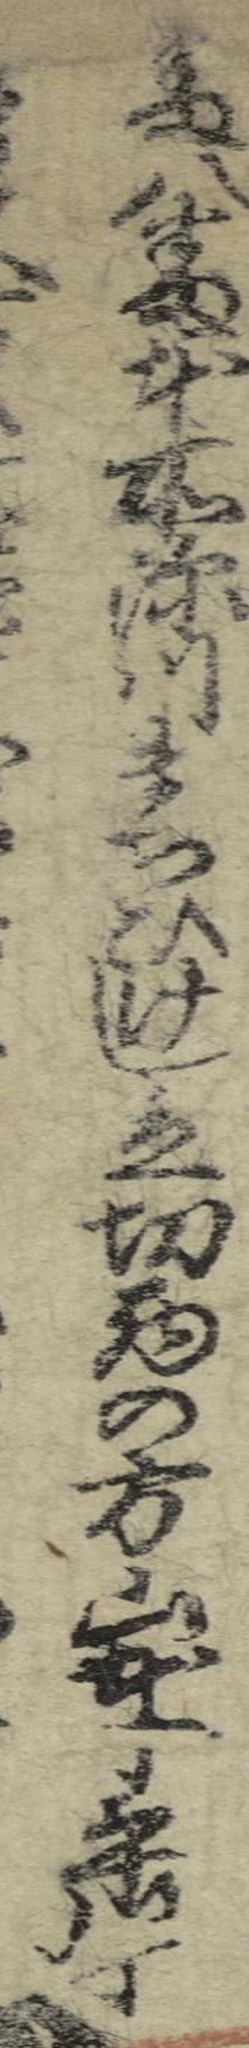番八番本所深川まちひけし立切西の方山本丁平川丁
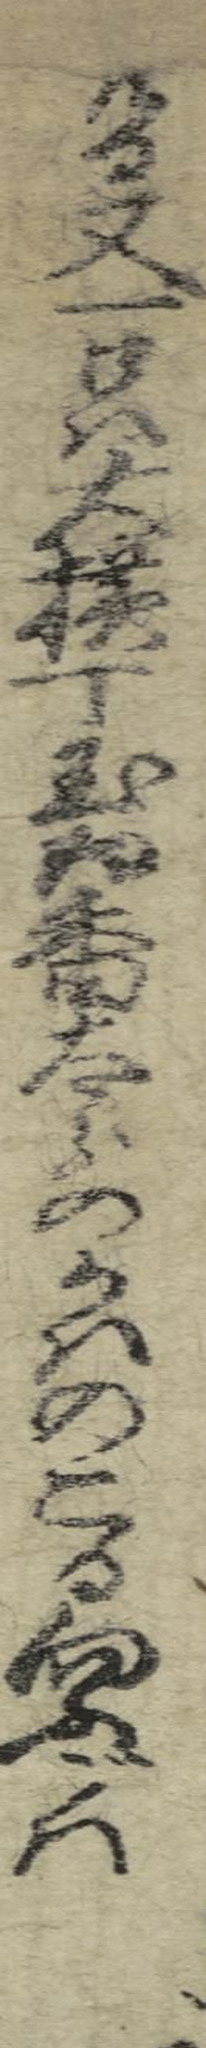ける又一口は大横丁玉内番太郎のかはのこる向ふは
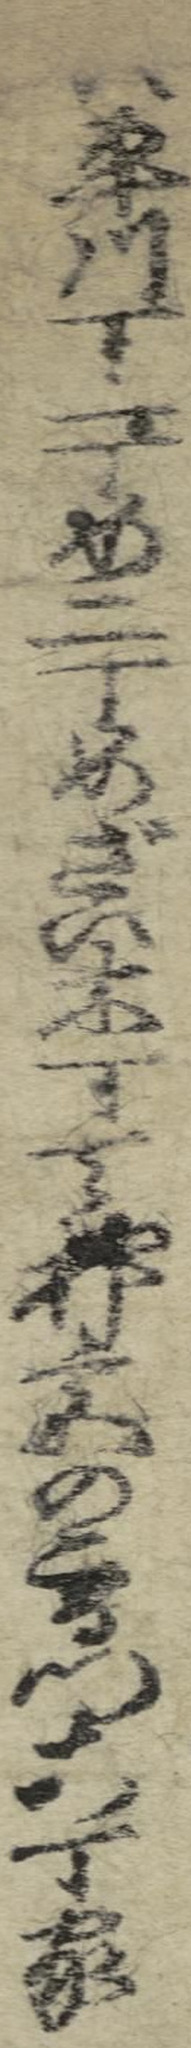平川丁一丁めざい木丁天神宮のこる門前丁家
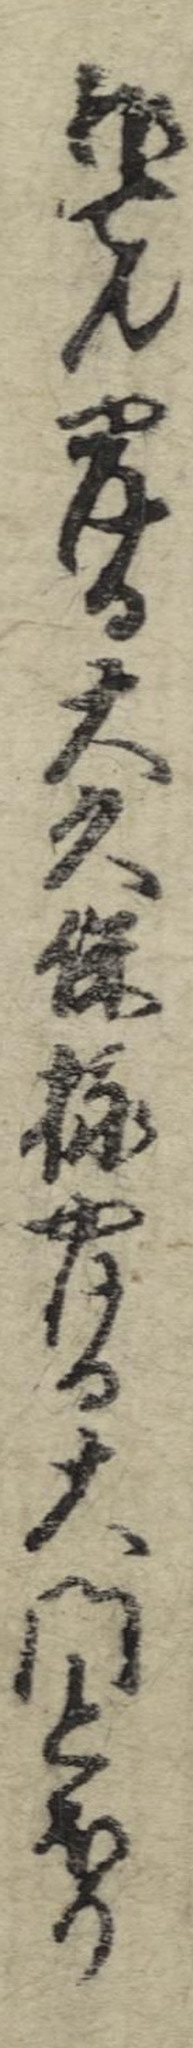御てんやける大久保様やける大門とほり
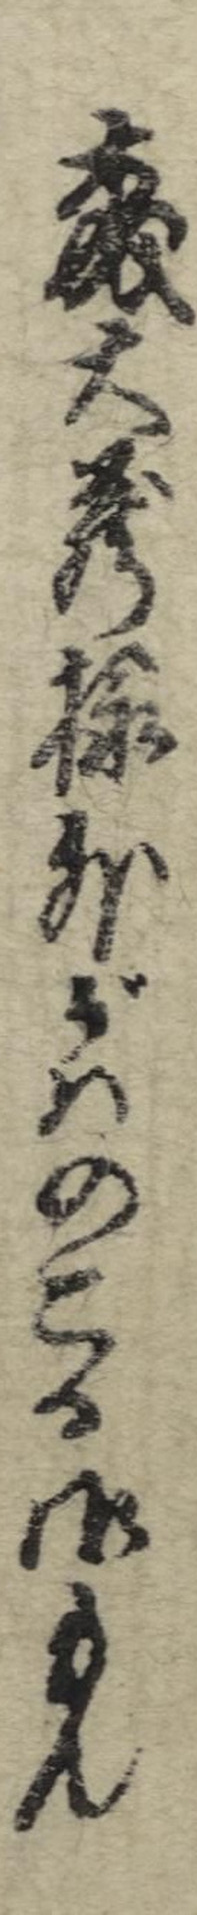森大蔵様外がはのこる御もん
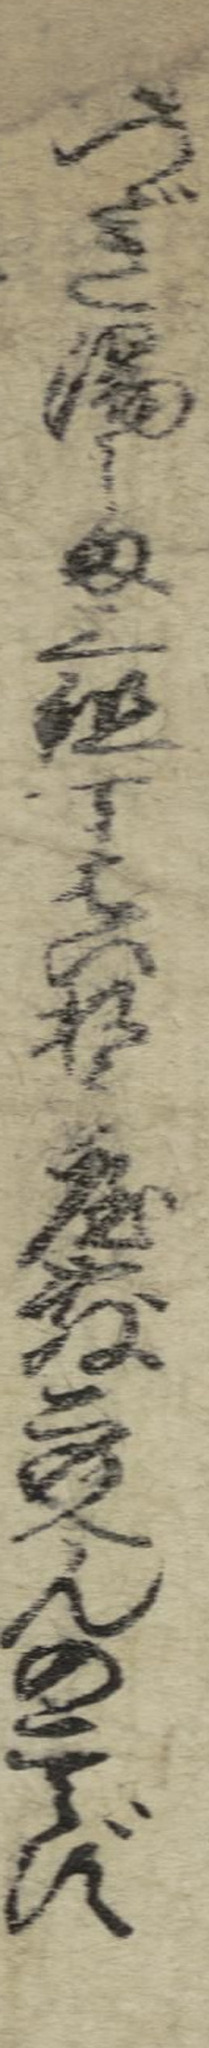つぎ湯しま三組丁はは様御屋敷このへんのこらず
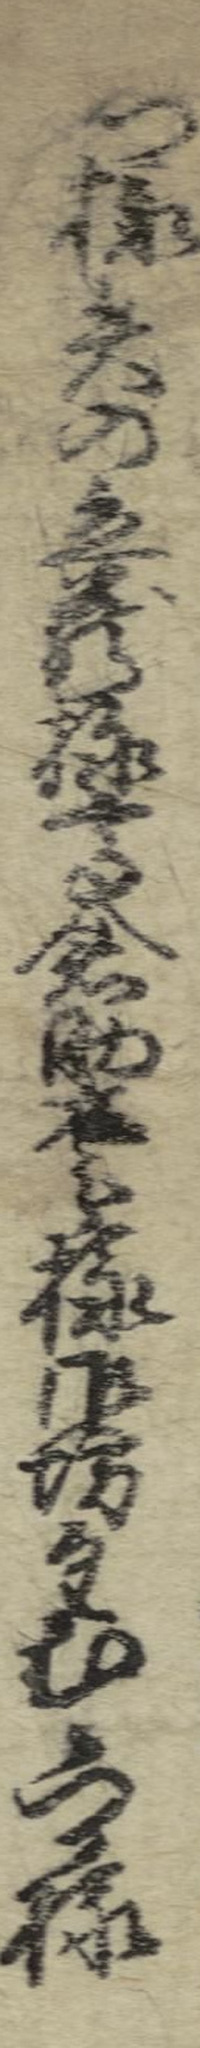門様矢の立蔵様高倉助五郎様御坊主ひらつか様
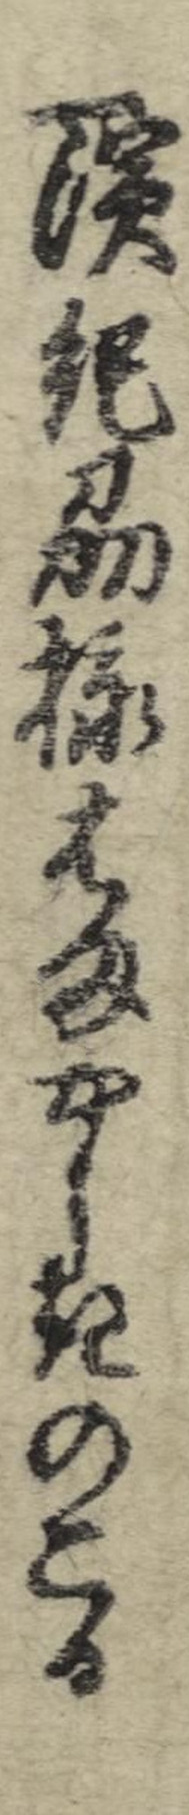浜紀州様はまやしきのこる
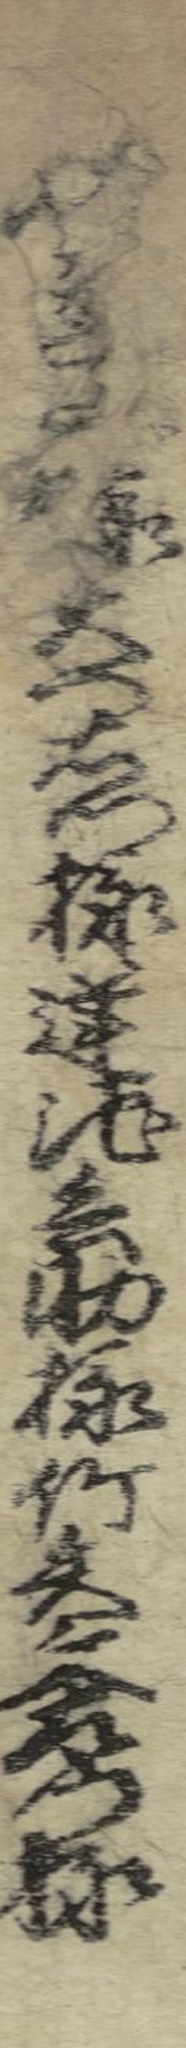様大つ右門様蓮池兵助様竹矢又左衛門様
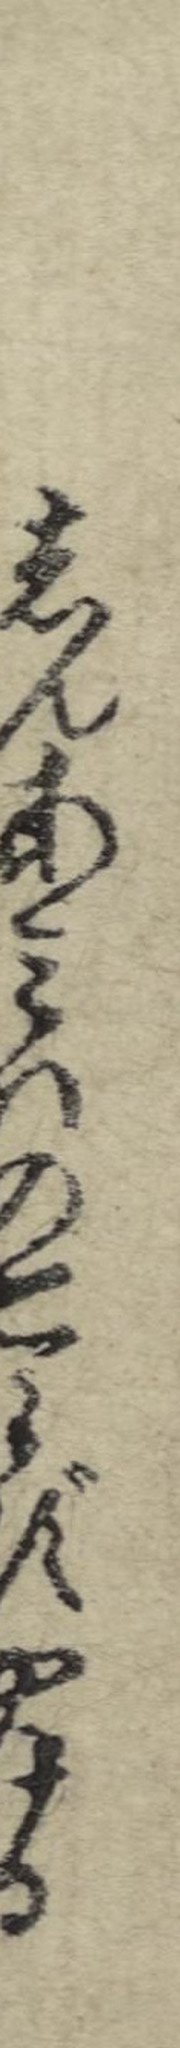しんあみはのこらずやける
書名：[嘉永三年二月の江戸大火に関する瓦版]
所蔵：東京大学地震研究所図書室 Earthquake Research Institute Library, The University of Tokyo, JAPAN
